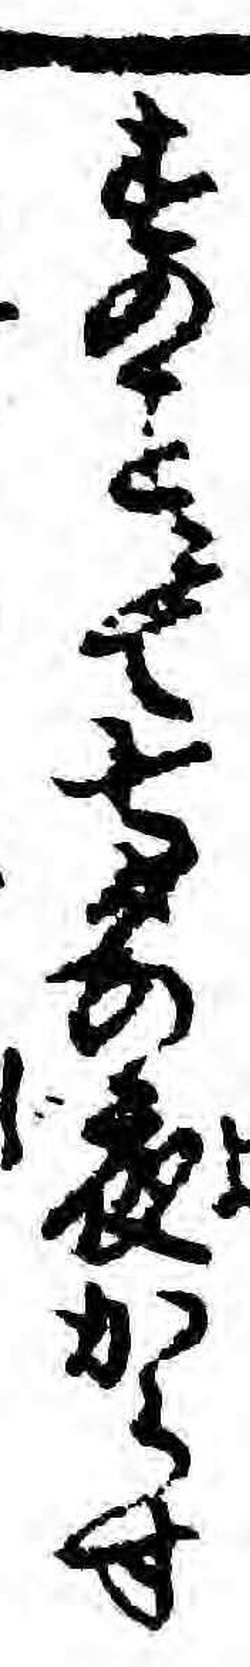すのことにて七夕の夜からす
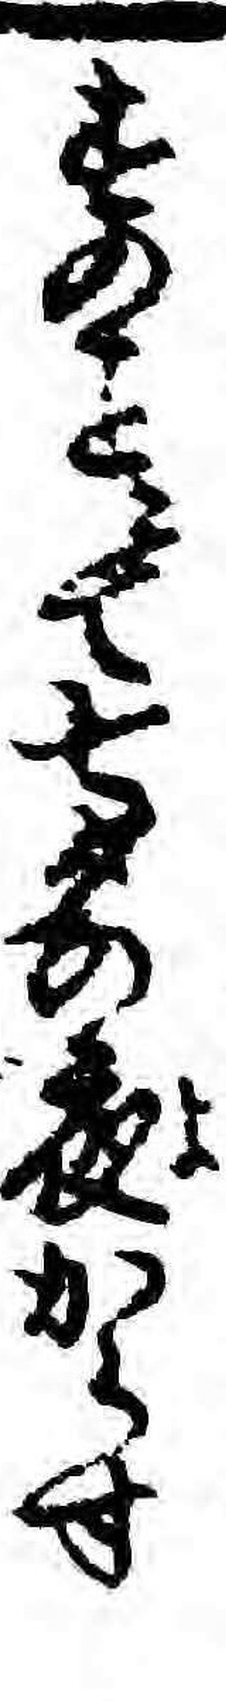すのことにて七夕の夜からす
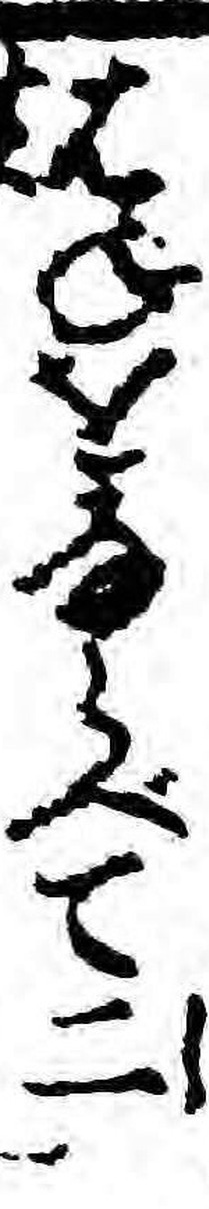はねをならべて二
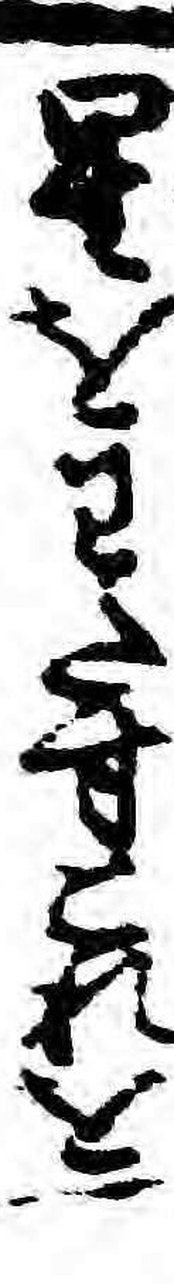星をわたすこれを
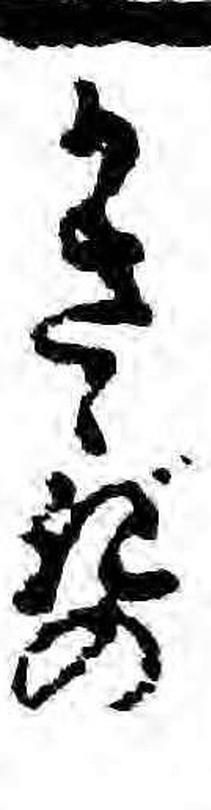かさゝぎの
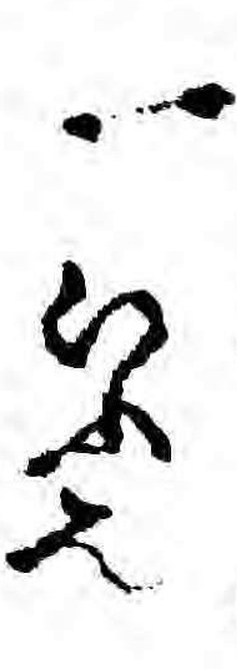いふ也
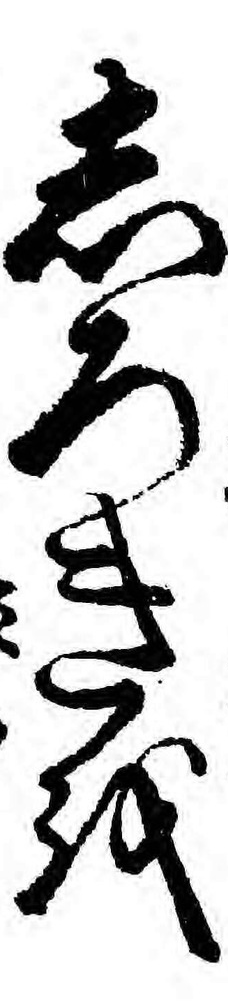しろきを
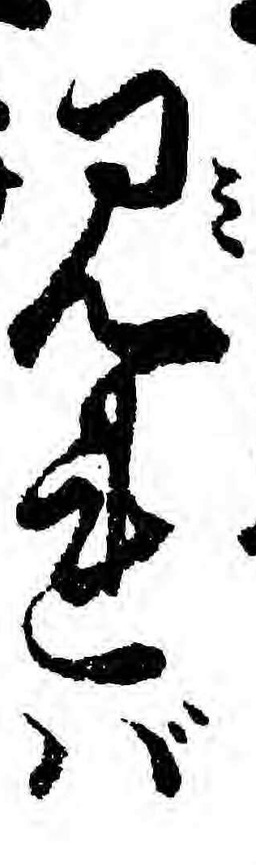見れば
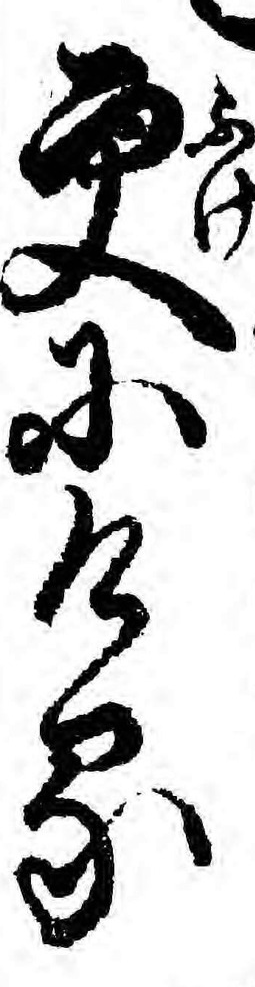更にける
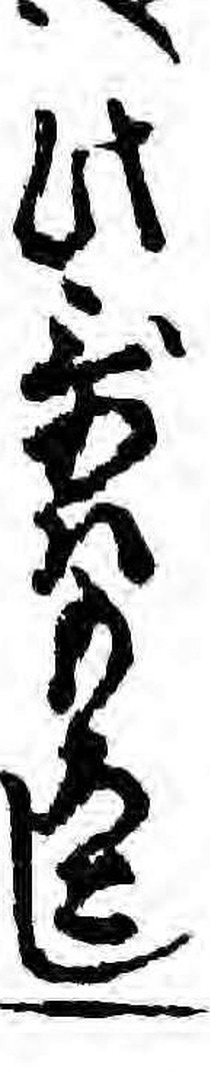此哥はもろこし
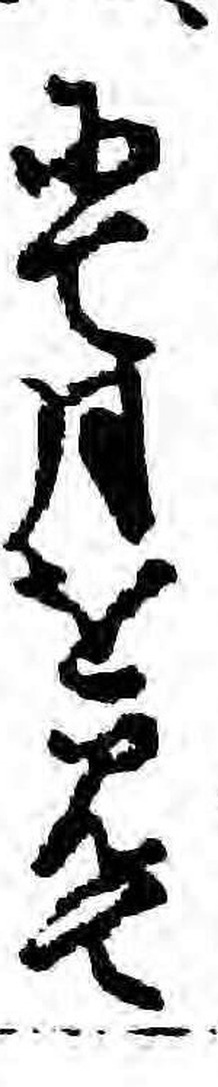にて月を見て
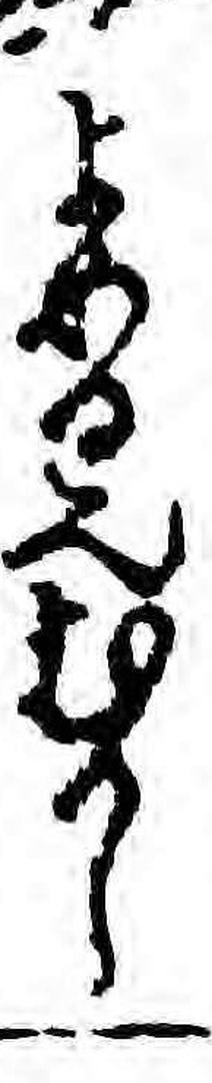よめる也むかし
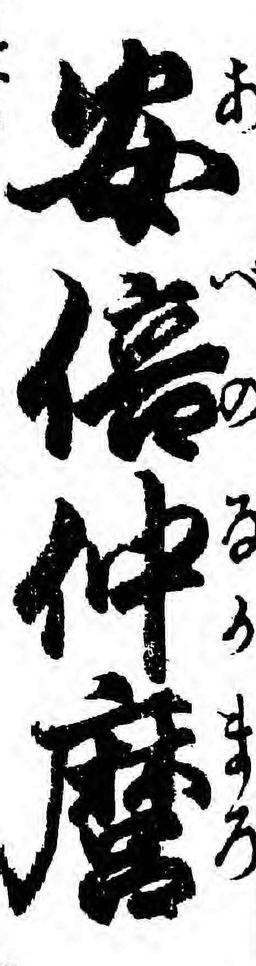安倍仲麿
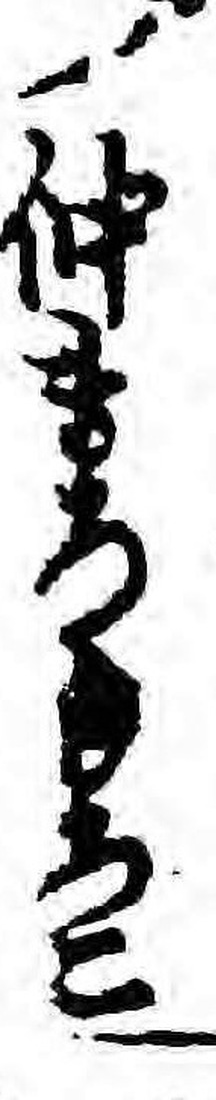仲まろもろこ
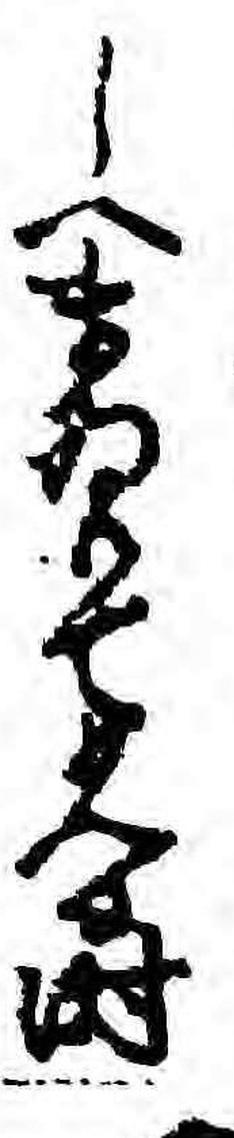しへまゐりてかへる時
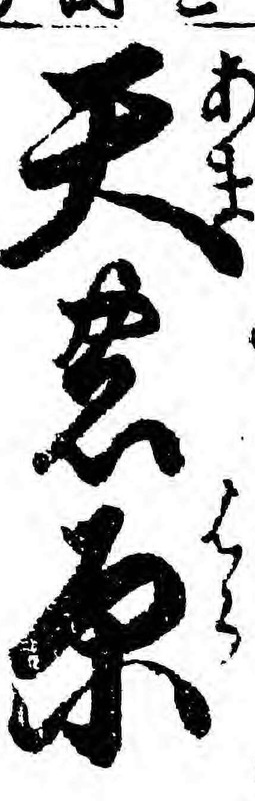天の原
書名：頭書和歌注譯／壽賀多百人一首小倉錦
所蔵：国文学研究資料館
